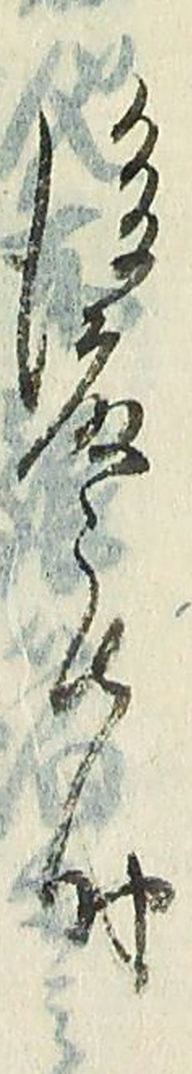後藤庄助
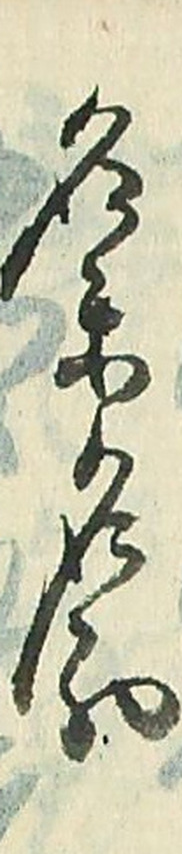名東名西
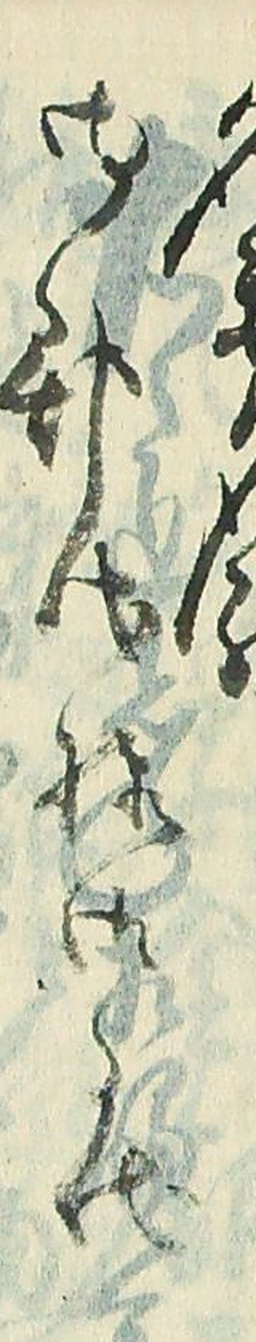御郡代様御手代
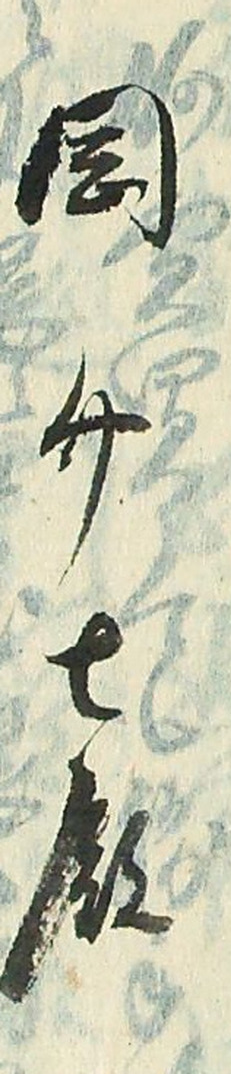岡介七殿
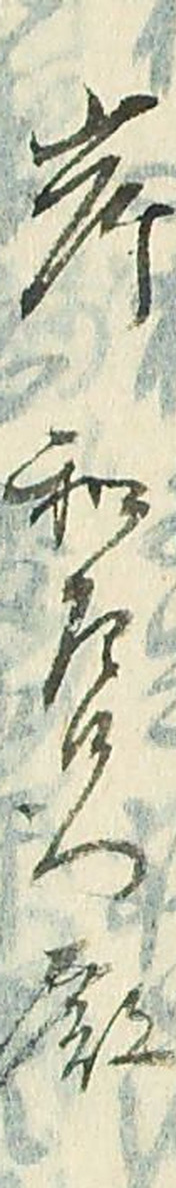岸和左衛門殿
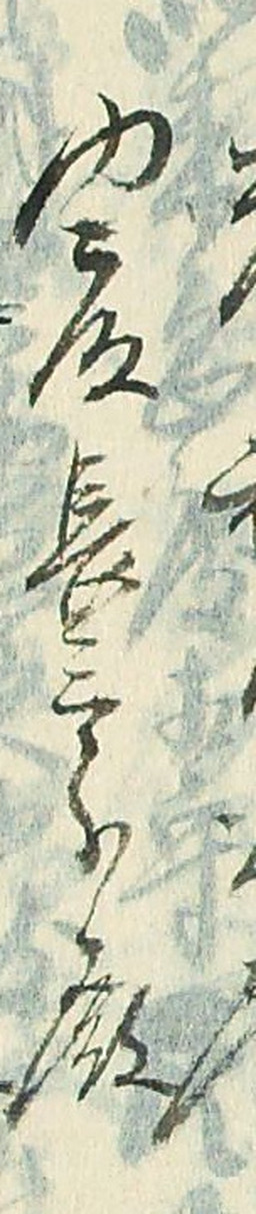内藤長三郎殿
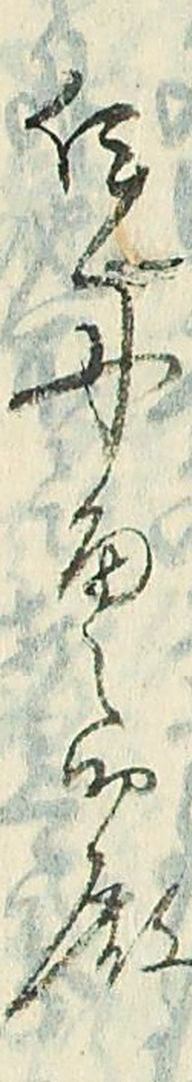伊丹角之助殿

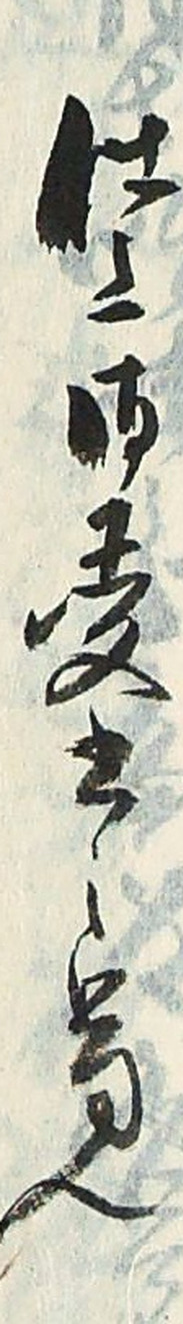仕上御受書之覚
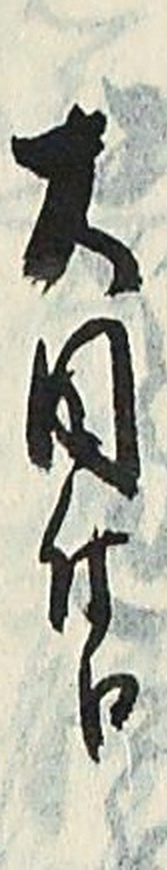大目付江
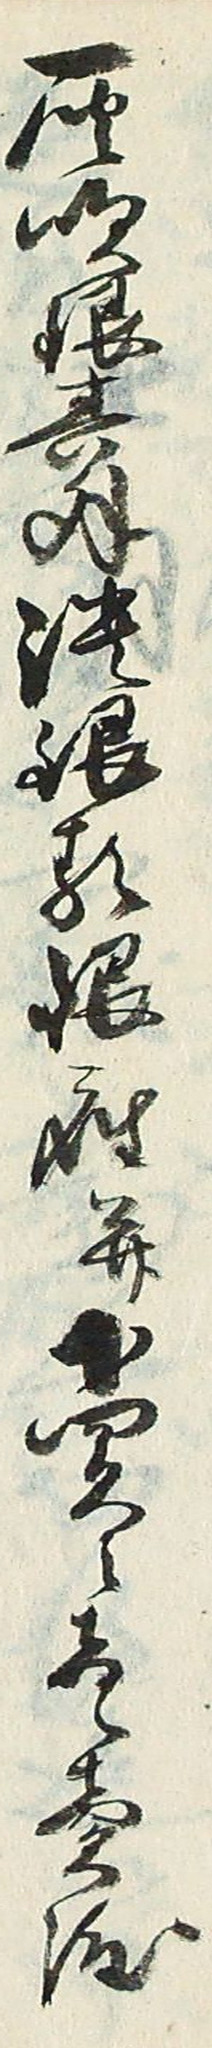灰吹銀其外潰銀類銀座幷下買之者へ売渡
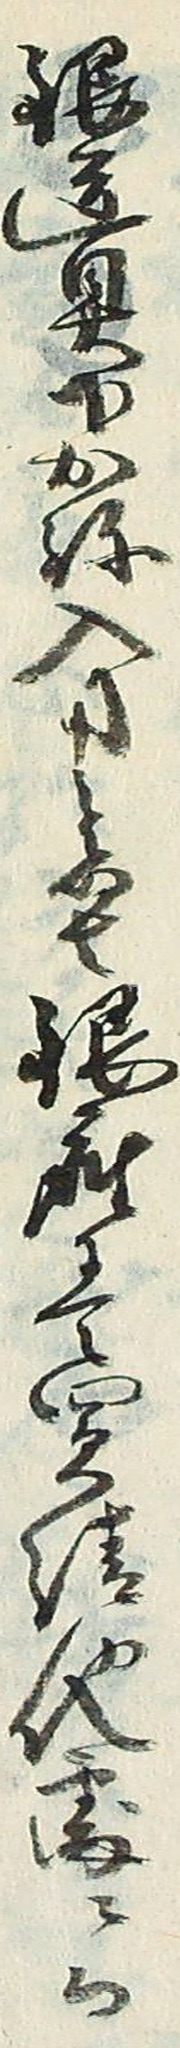銀道具下かね入用之者は銀座にて買請他処にて
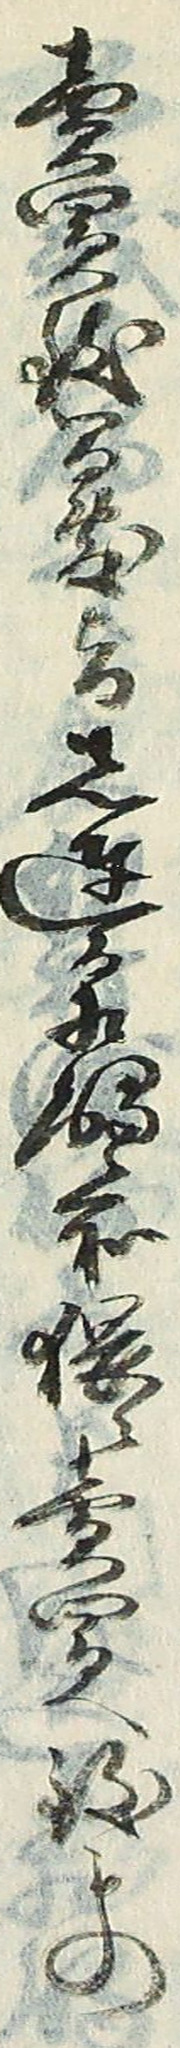売買致間敷旨先達而相触候所猥に売買致もの
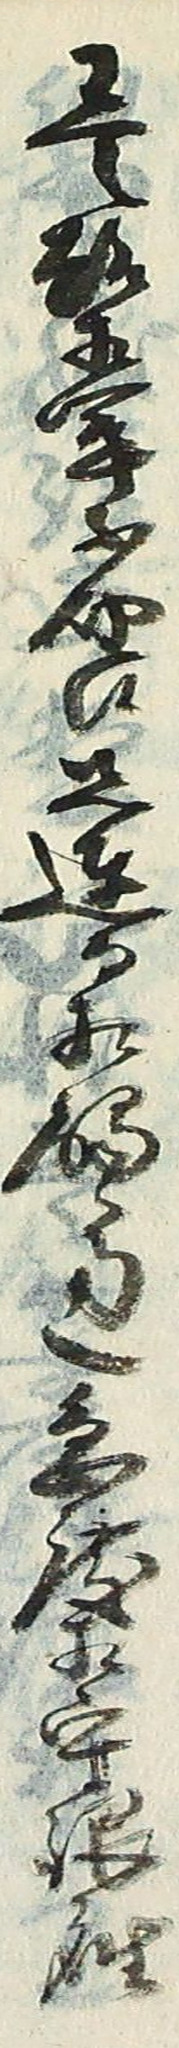有之趣相聞不届候先達而相触候通急度相守銀座
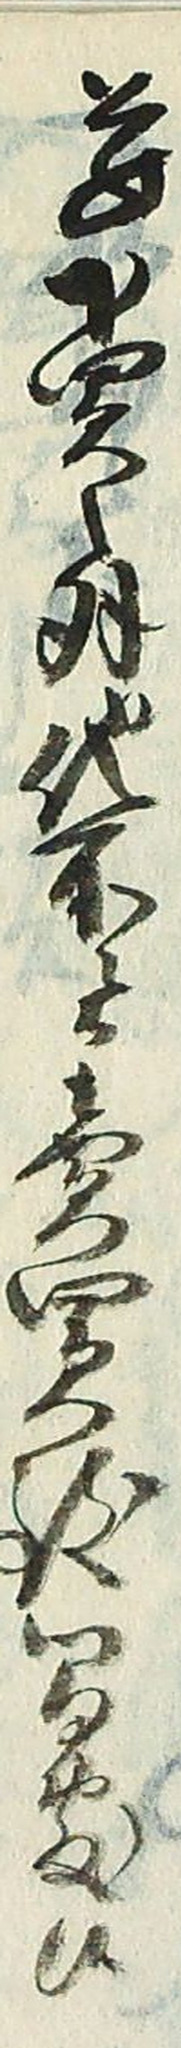幷下買之外他所にて売買致間敷候
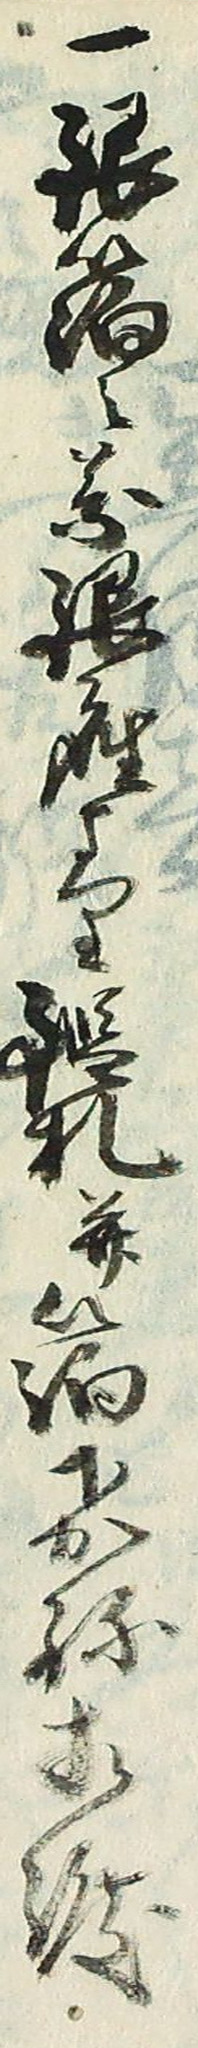一銀箔之義銀座より鑑札幷箔下かね相渡
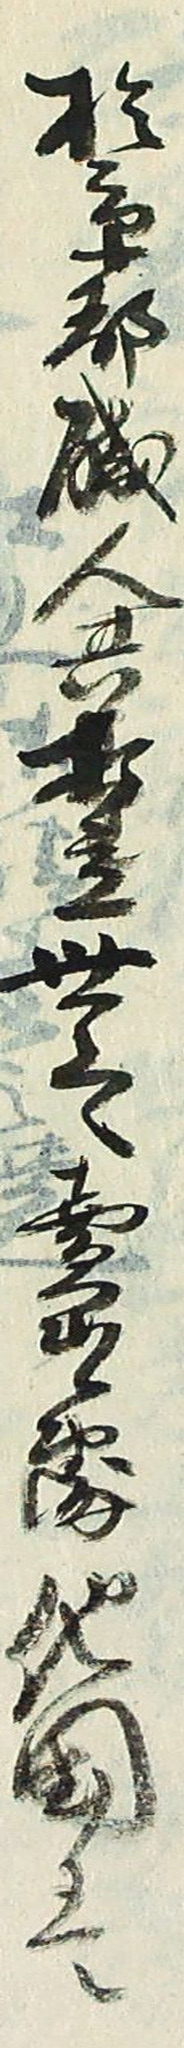於京都職人共打立世上へ売出候処他国にて
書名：諸御用御□受書控
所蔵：鳴門教育大学 Naruto University of Education
